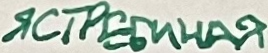ястребиная
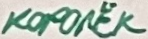королёк
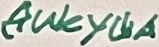дикуша
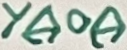удод
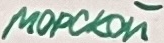морской
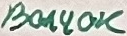волчок
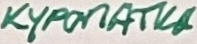куропатка
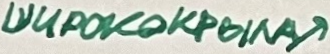ширококрылая
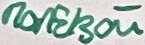полевой
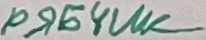рябчик
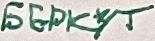беркут
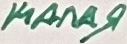малая
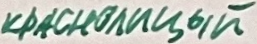краснолицый
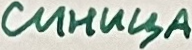синица
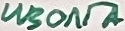иволга
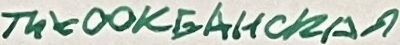тихоокеанская
